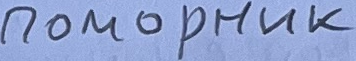поморник
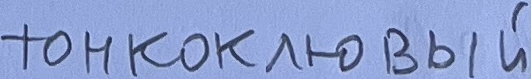тонкоклювый
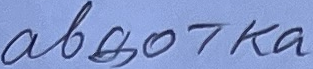авдотка
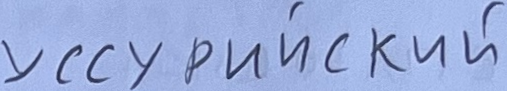уссурийский
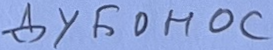дубонос
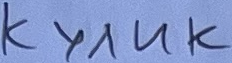кулик
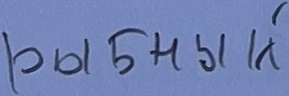рыбный
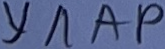улар
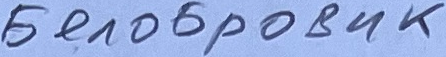белобровик
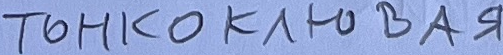тонкоклювая
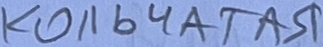кольчатая
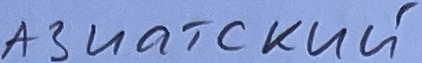азиатский
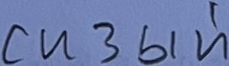сизый
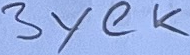зуек
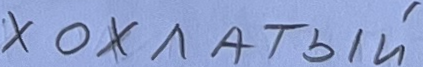хохлатый
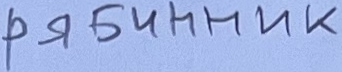рябинник
